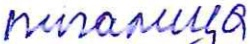пигалица
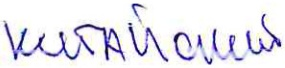китайский
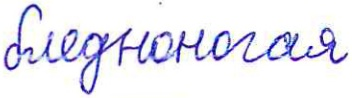бледноногая
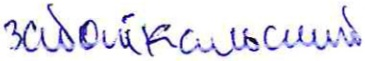забайкальский
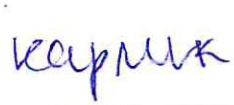карлик
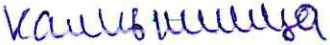камышница
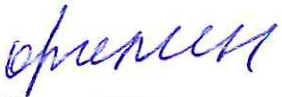филин
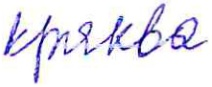кряква
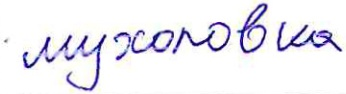мухоловка
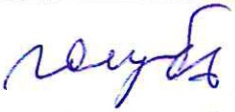голубь
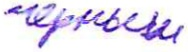черныш
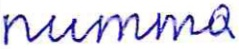питта
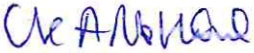скальная
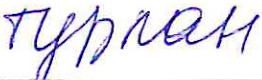турлан
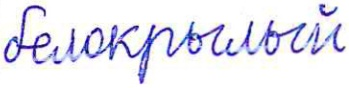белокрылый
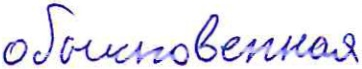обыкновенная
